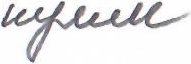кулик
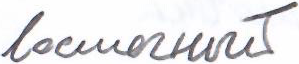восточный
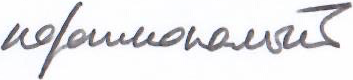короткопалый
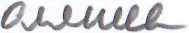оляпка
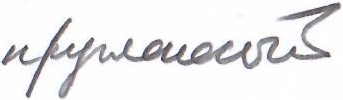круглоносый
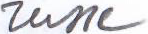чиж
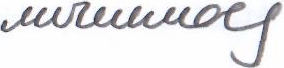личинкоед
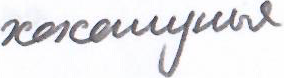хохотунья
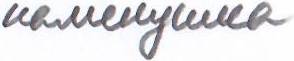каменушка
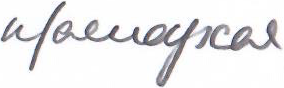красноухая
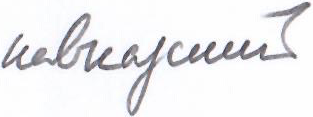кавказский
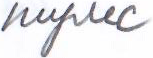тулес
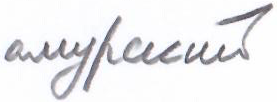амурский
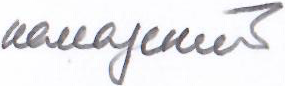канадский
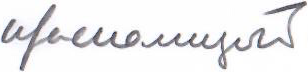краснолицый
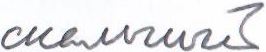скальный
